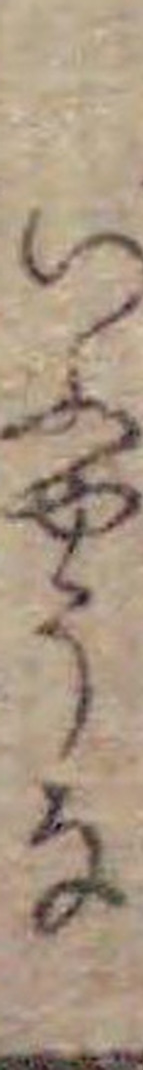いふやうな
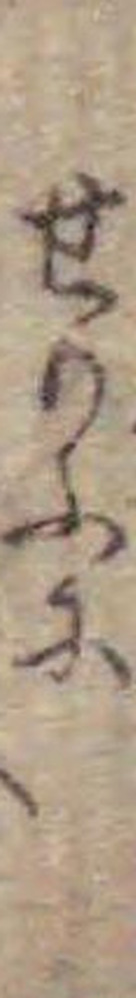せりふに
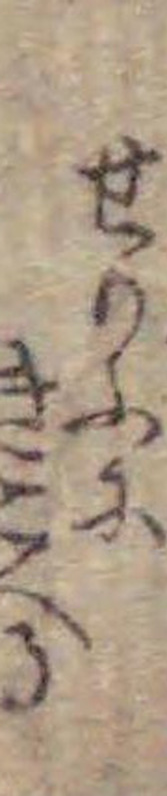せりふに
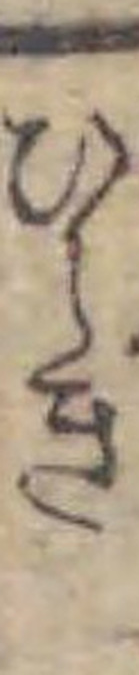ひらき
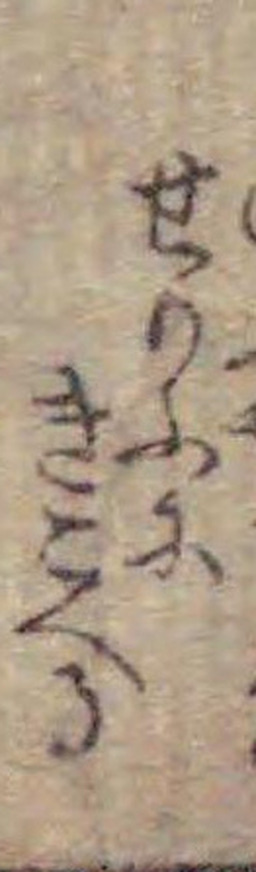きこへる
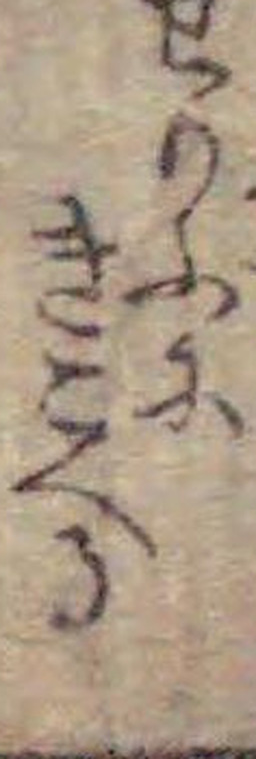きこへる
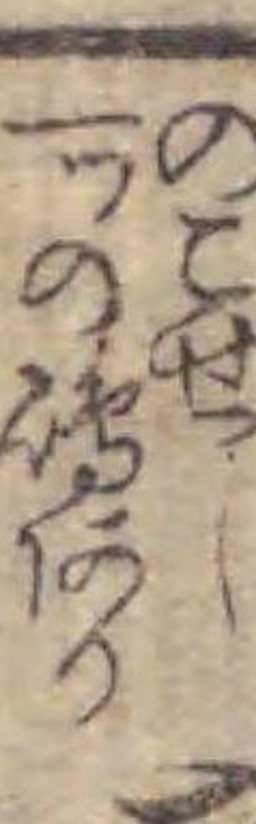一つの島あり
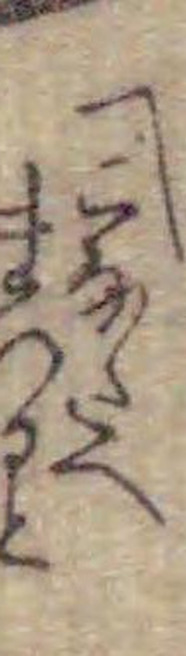〽こなたへ
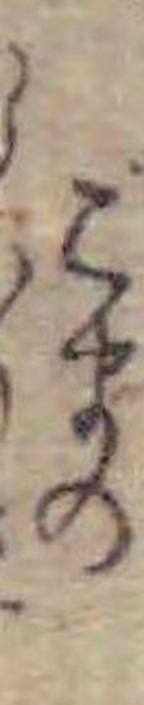ごまの
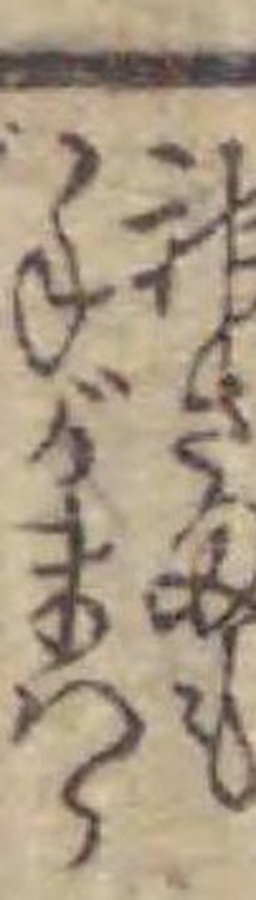手がまはら
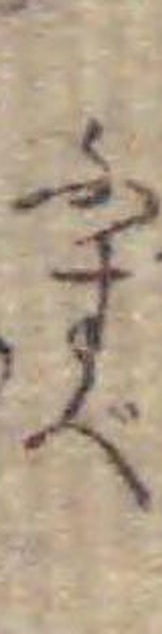ふすべ
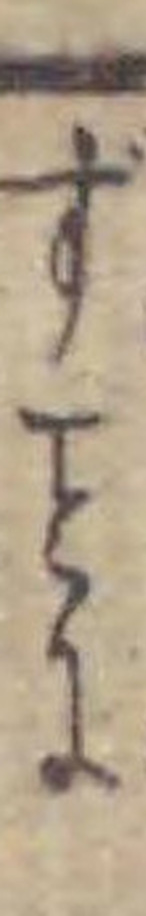ずことに
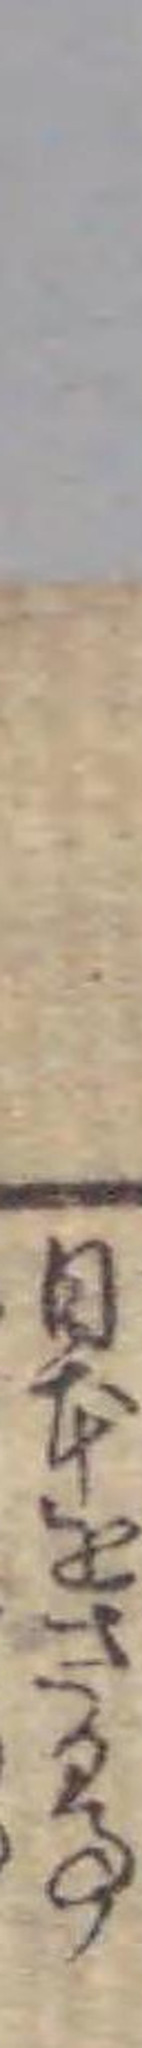日本をさる事
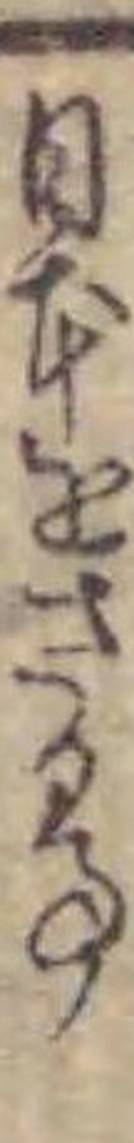日本をさる事
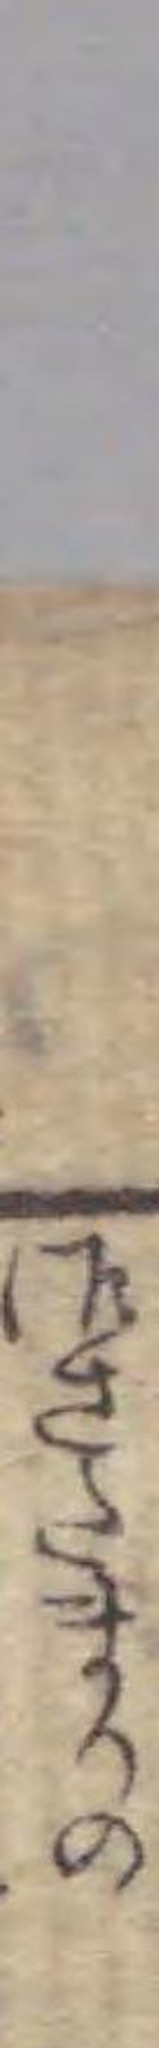御さたまりの
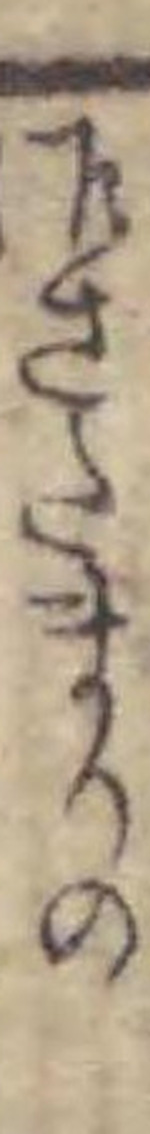御さたまりの
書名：奇妙頂礼胎錫杖 : 3巻
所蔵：国立国会図書館 National Diet Library, JAPAN
